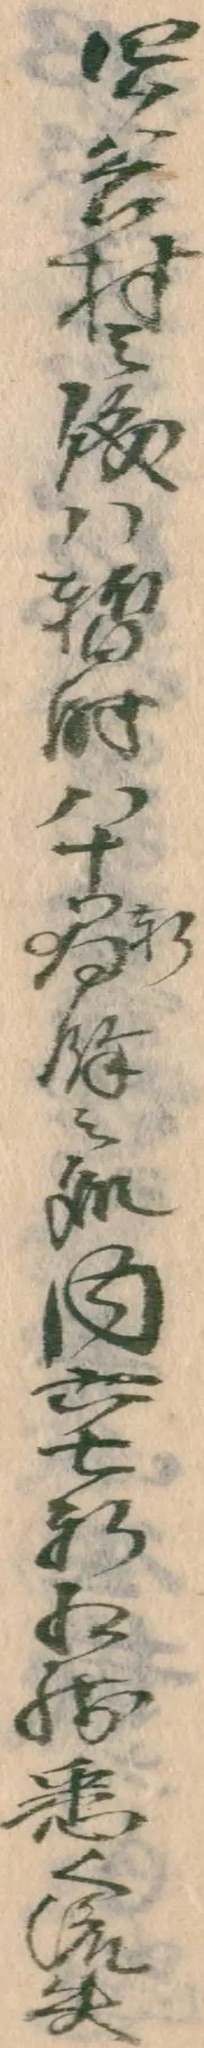四ツ谷村之儀ハ軒別八拾軒之処内六七軒相残悉く流失
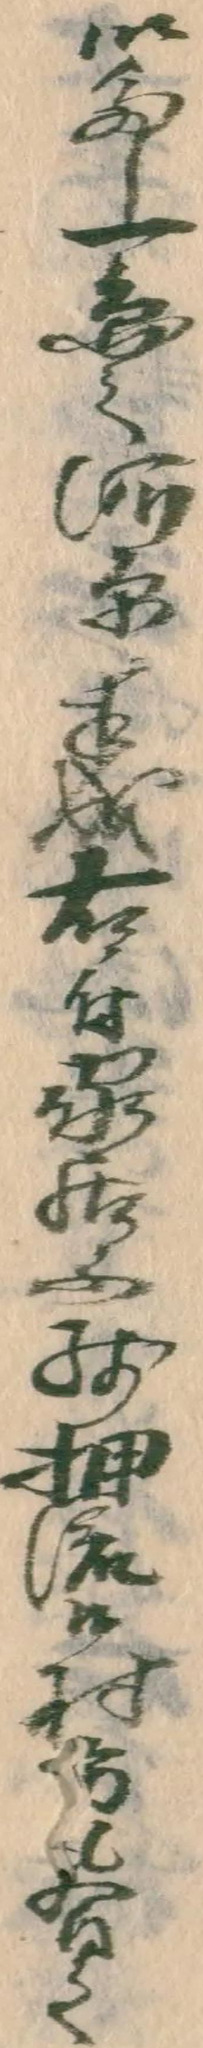いたし跡一円之河原ニ相成右ニ付家居不残押流候村方も有之
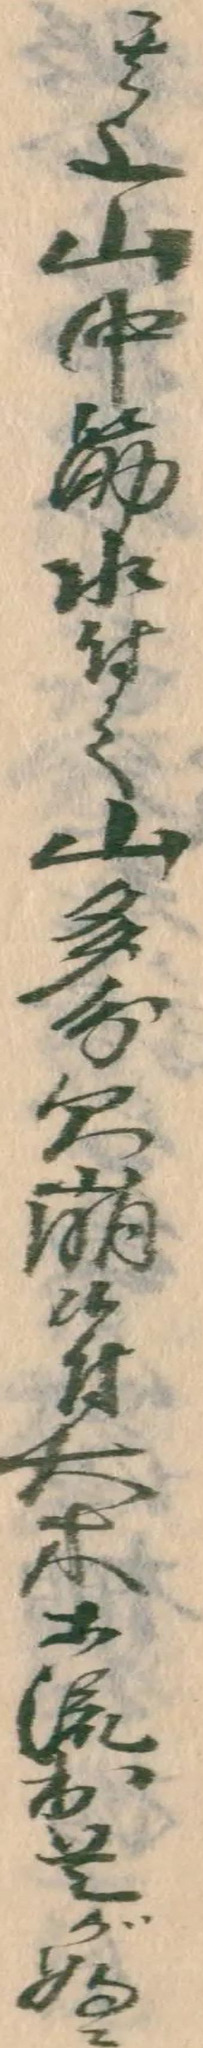其上山中筋水付之山多分欠崩候ニ付大木等押出是が為ニ
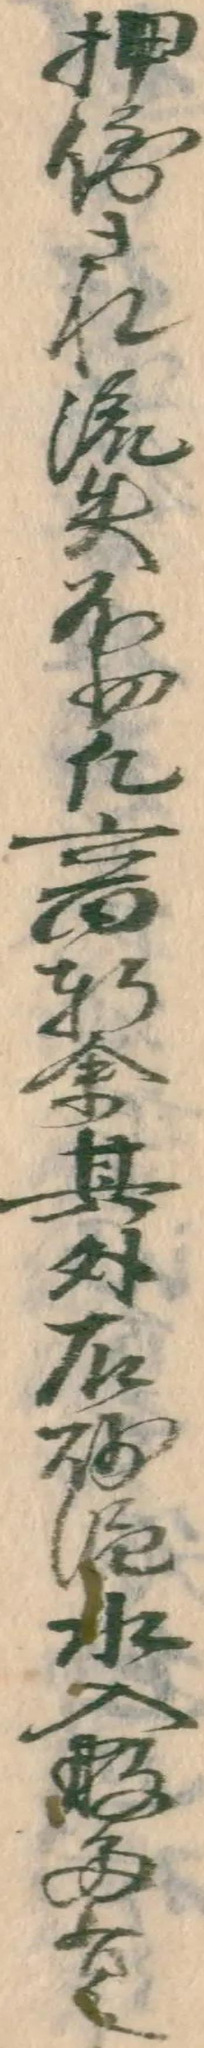押倒され致流失不少流凡六百軒余其外石砂泥水入数多有之
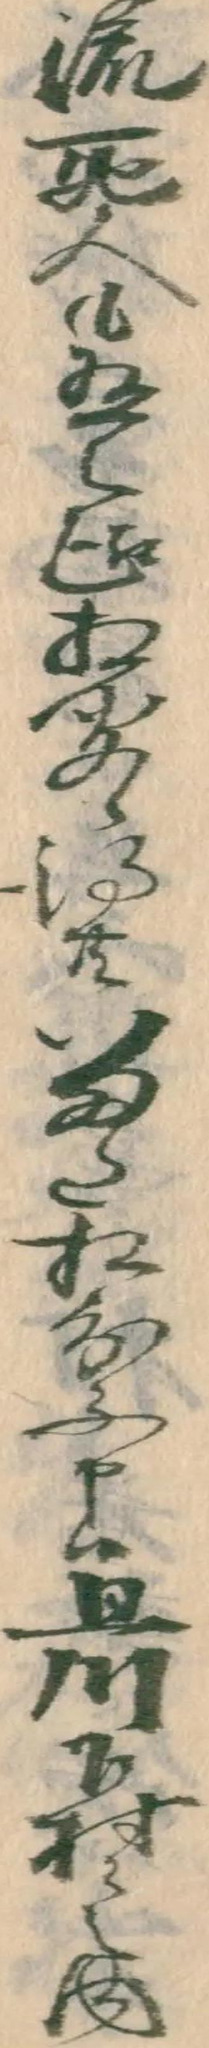流死人も有之趣相聞候得共いまた相分不申候且川下村々之内
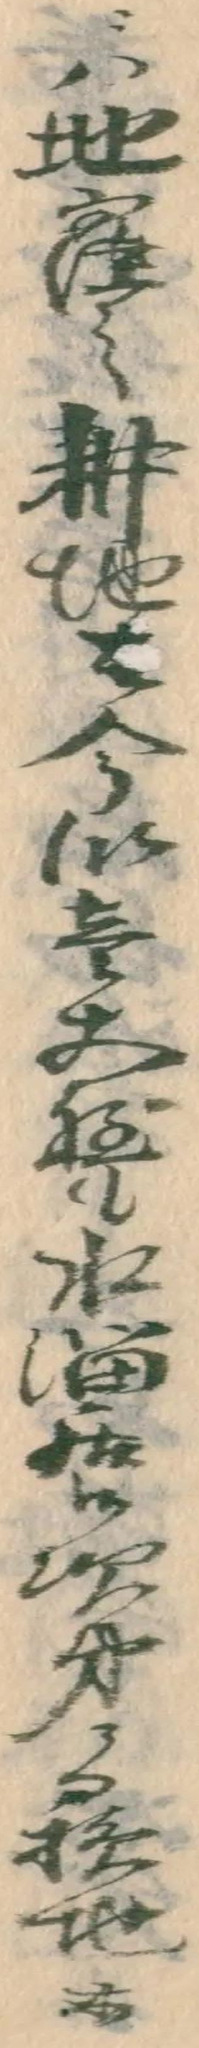ニハ地窪之耕地ハ今以壱丈程も水溜居候次第ニ而損地等
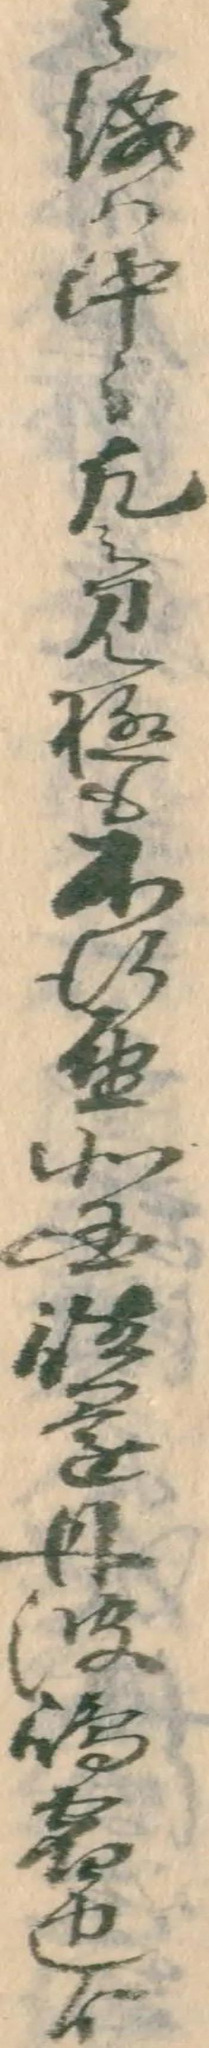之儀ハ中々凡之見極も不行届北国往還丹波嶋宿辺ゟ

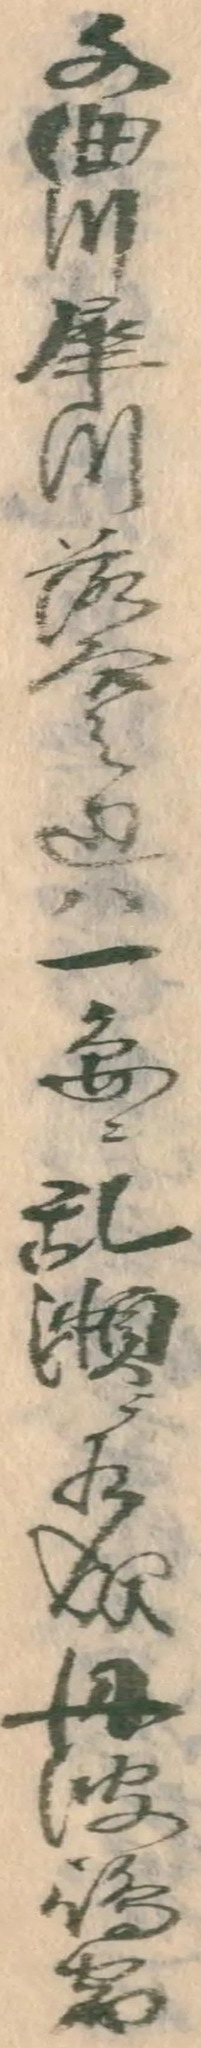千曲川犀川落合之辺ハ一円乱瀬二相成丹波嶋宿
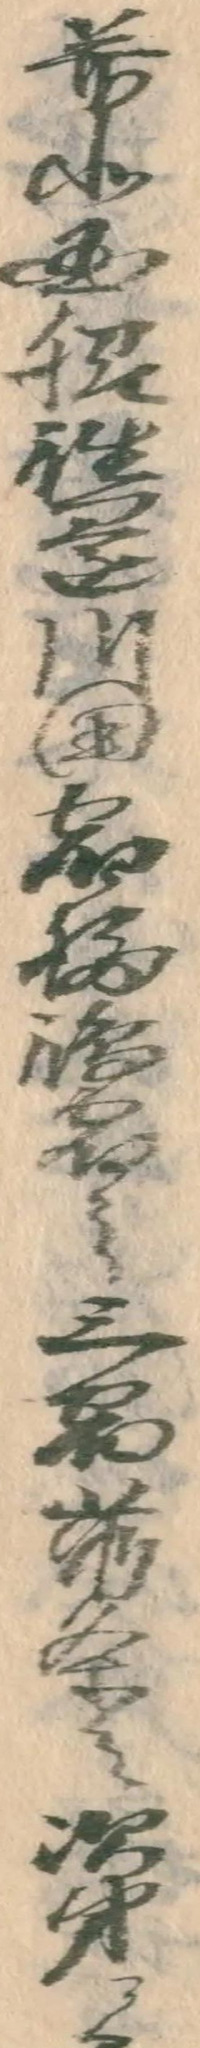并北国脇往還川田宿福島宿之三宿前条之次第ニ而
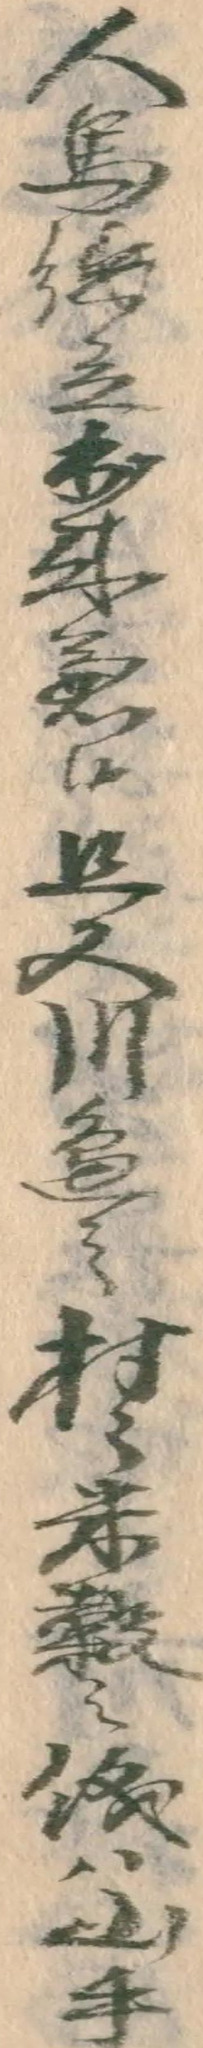人馬継立出来兼候且又川辺之村々米穀之儀は山手
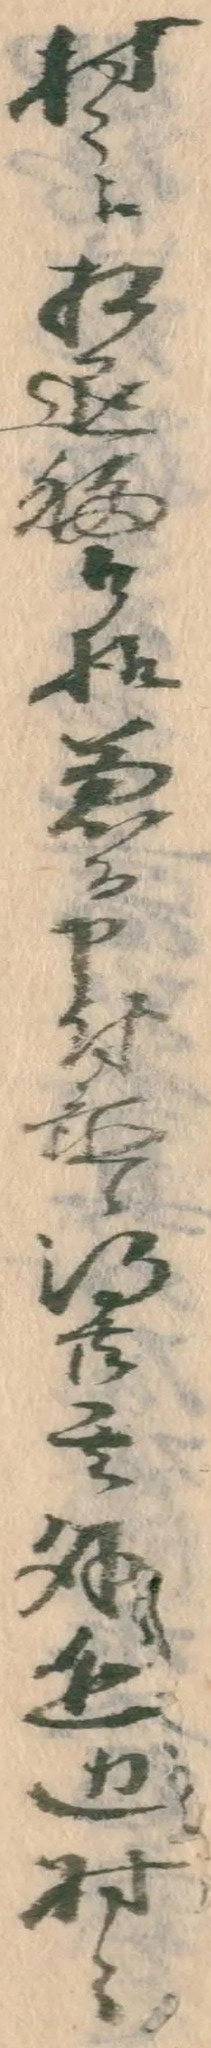村々江相退転候様兼而申付置候得共其外近辺村々
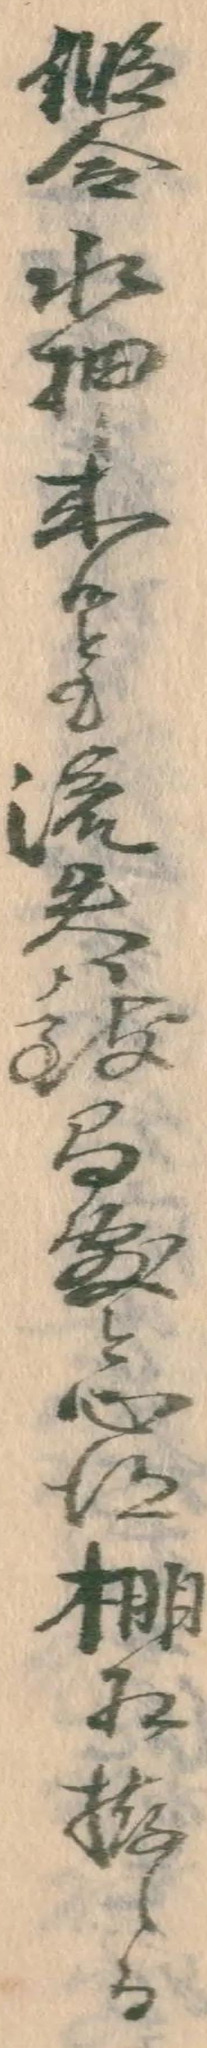仮令水押来候とも流失ハ致間敷と心得棚相拵候而
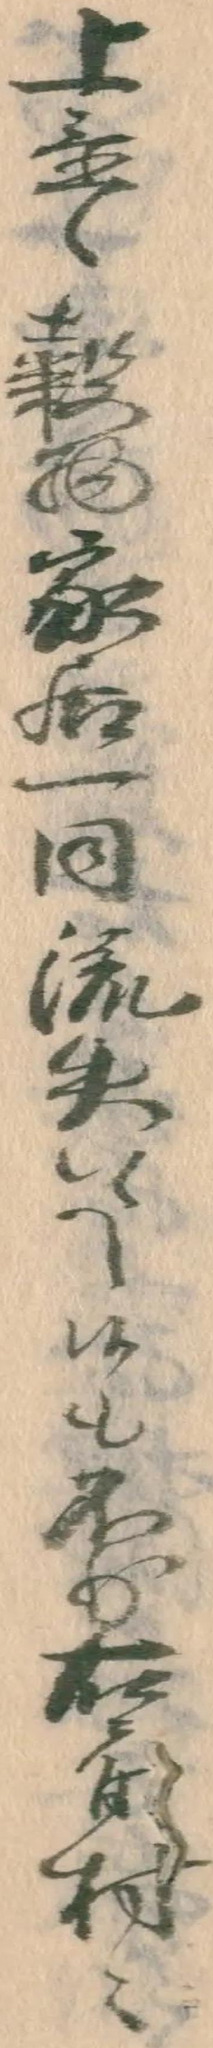上置候穀物家居一同流失いたし候も不少右ニ付村々
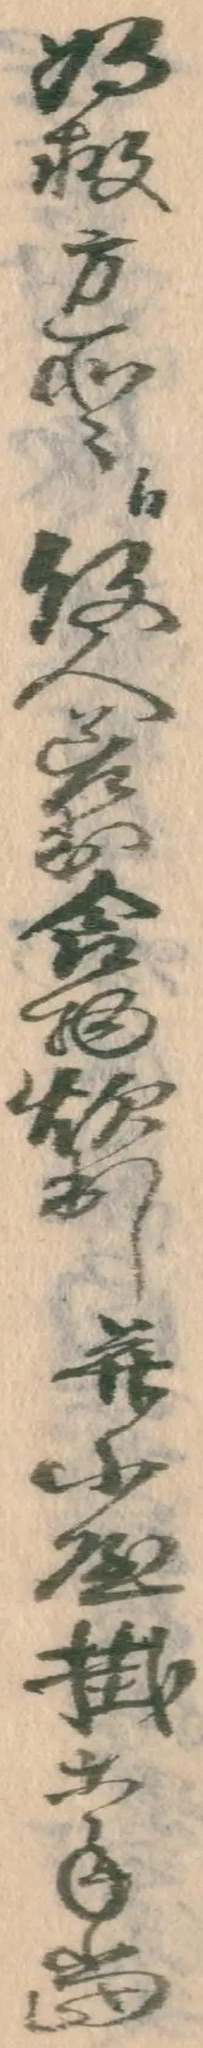好救方所々江役人差出食物炊出し并小屋掛等手当
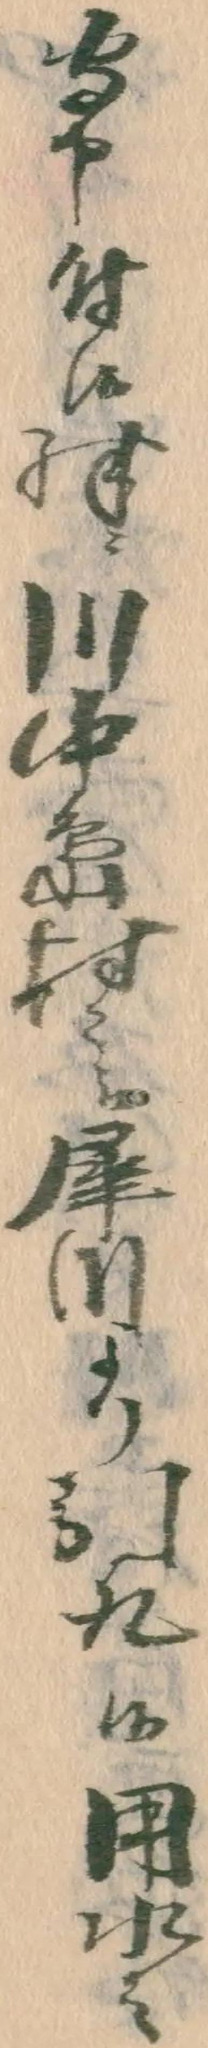等申付候殊ニ川中島村々江犀川より引取候用水之
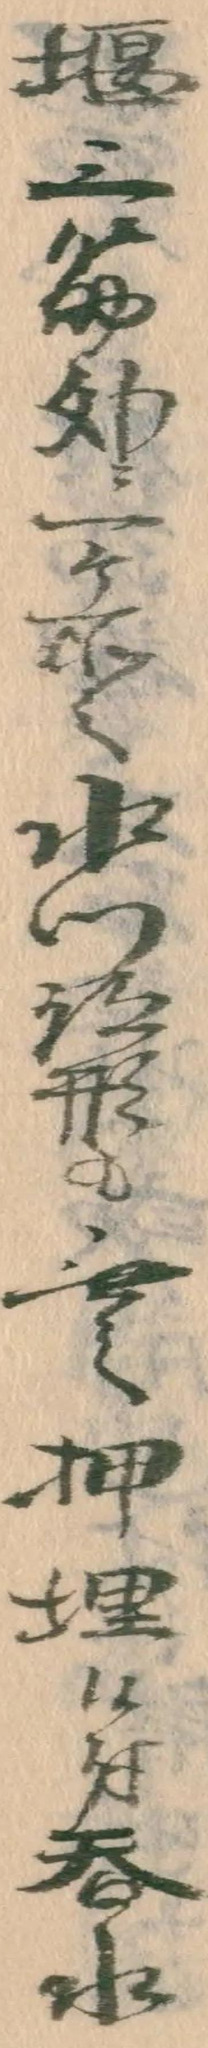堰三筋外ニ一ケ所之水門跡形も無之押埋候付呑水
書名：信州大地震之記
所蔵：国立国会図書館 National Diet Library, JAPAN
